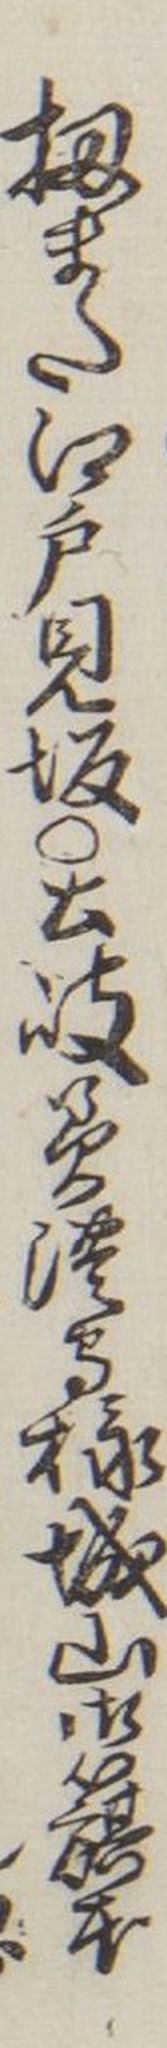扨また江戸見坂○土岐美濃守様山城御簱本
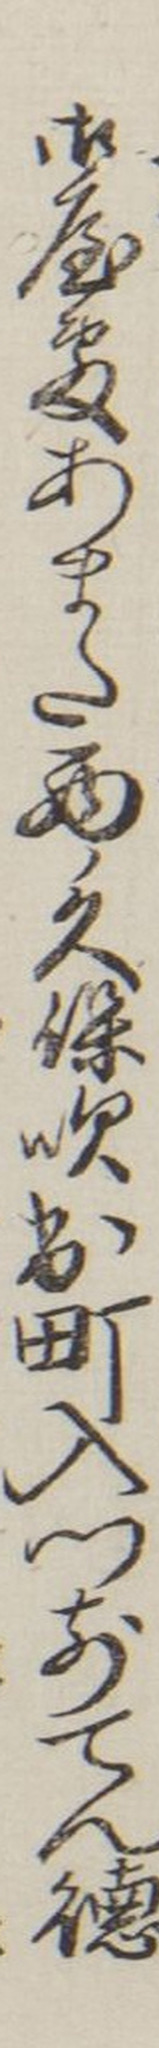御屋敷あまた西の久保吹出町入門前てん徳
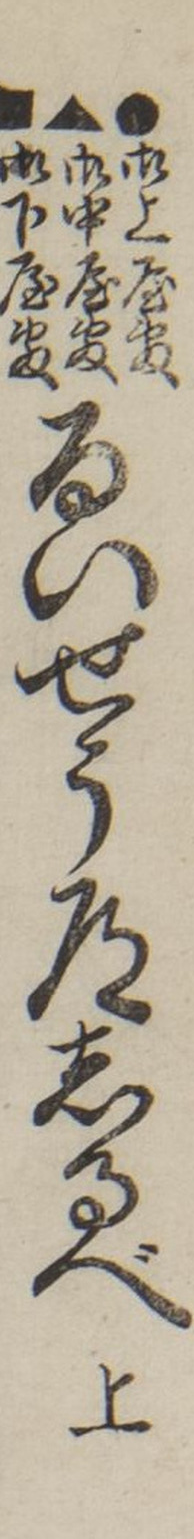▲御中屋敷るいせう道しるべ上
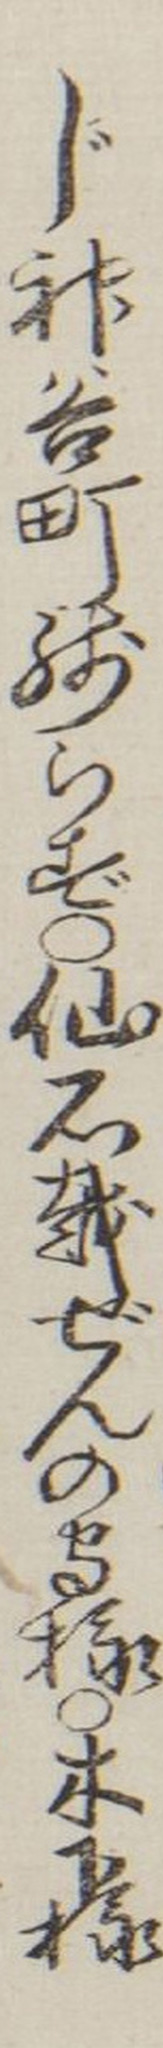じ神谷町残らず○仙石越ぜんの守様○木下様
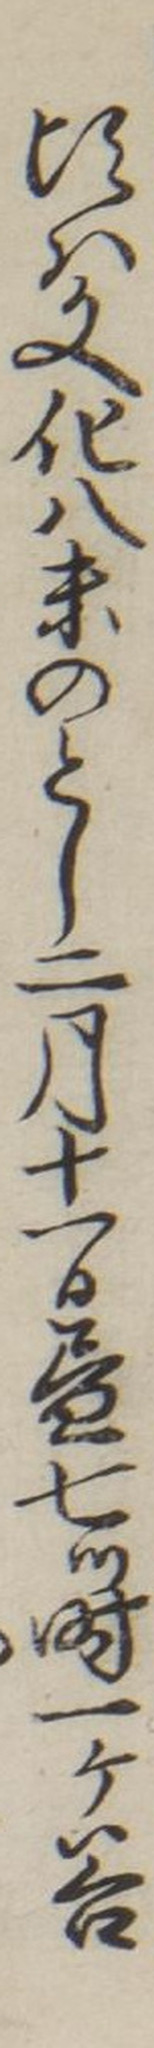頃は文化八未のとし二月十一日昼七ツ時一ヶ谷
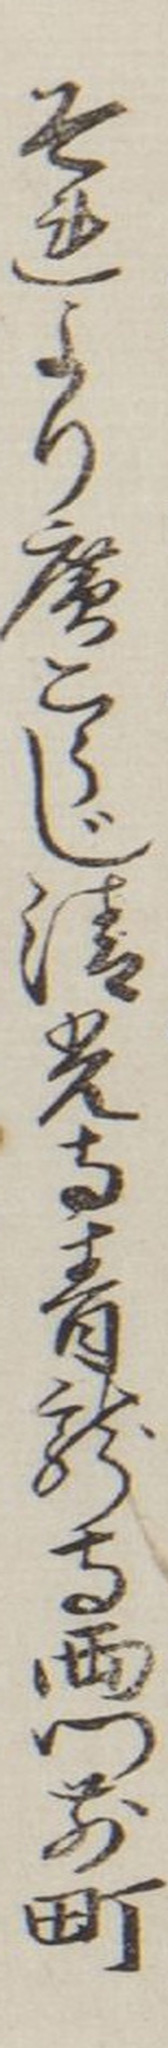それより広こうじ清光寺青龍寺両門前町
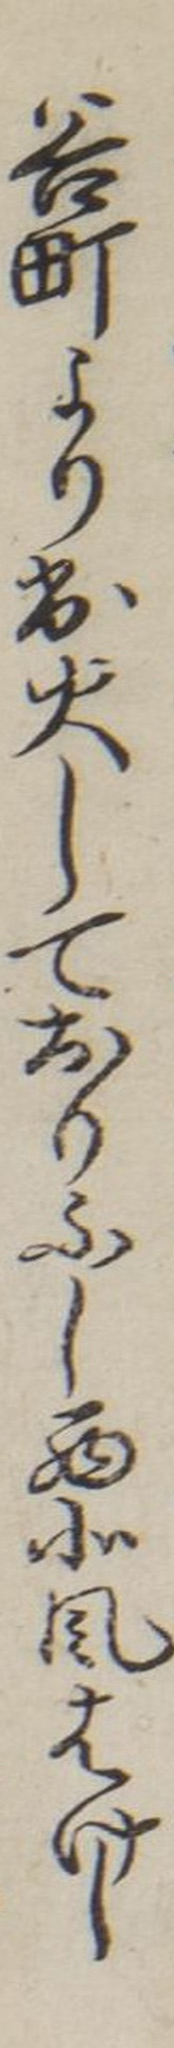谷町より出火しておりふし西北風はけし
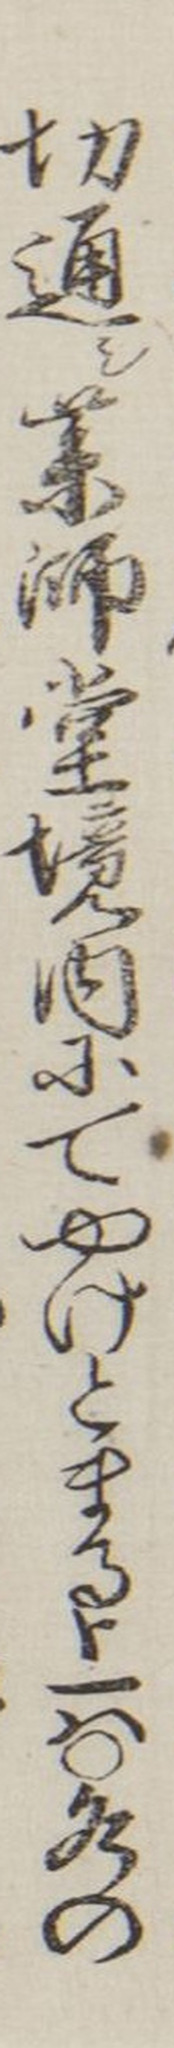切通し薬師堂境内にてやけとまる上は○水の
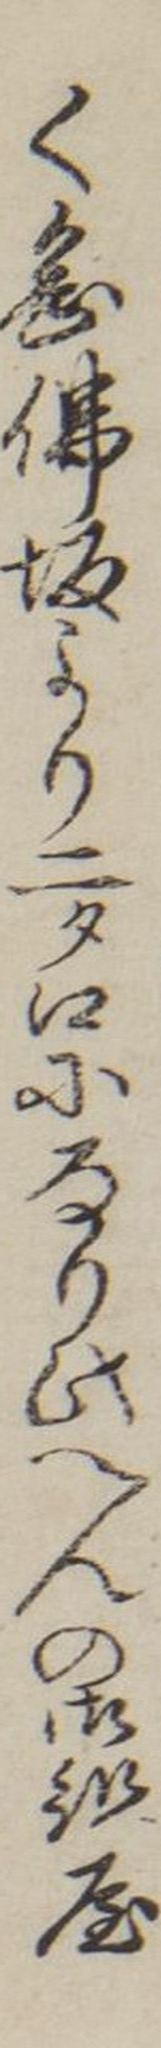く念仏坂より二た口になり此へんの御組屋
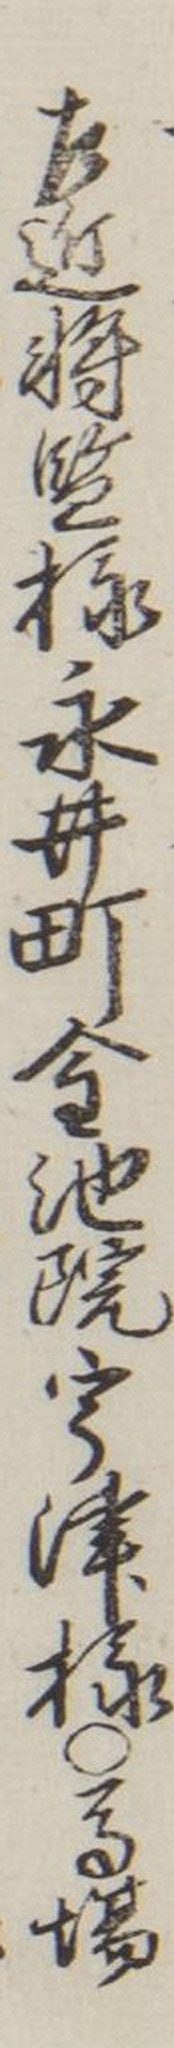左近将監様永井町金池院宇津様○馬場
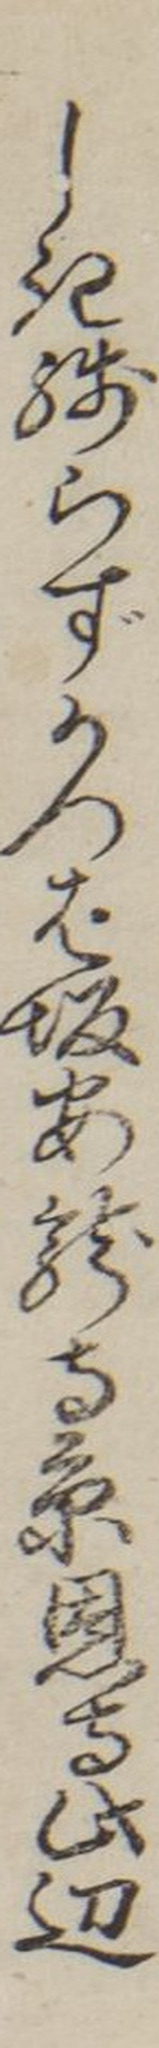しき残らずかつぱ坂安龍寺京恩寺此辺
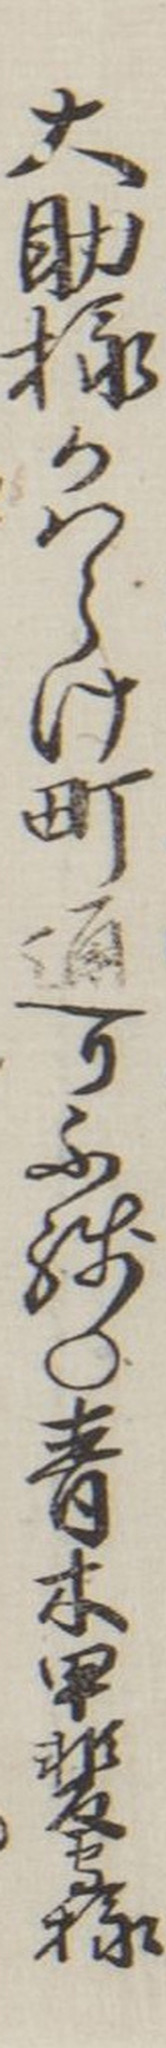大助様かはらけ町通り不残○青木甲斐守様
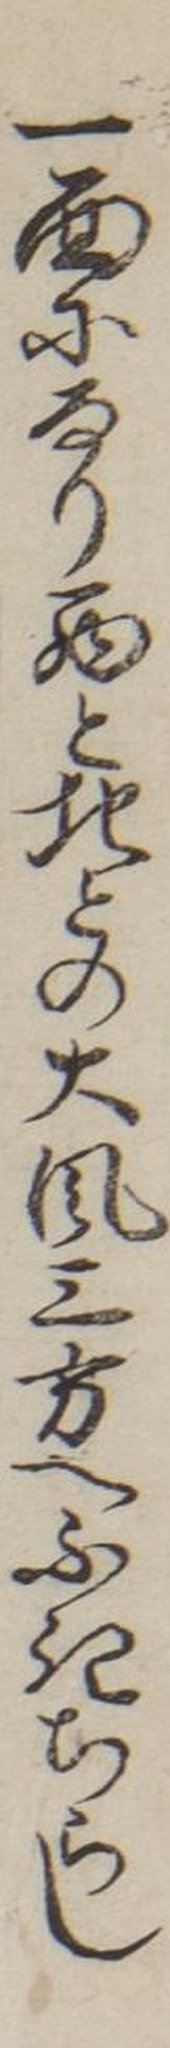一面になり西と北との大風三方へふきちらし
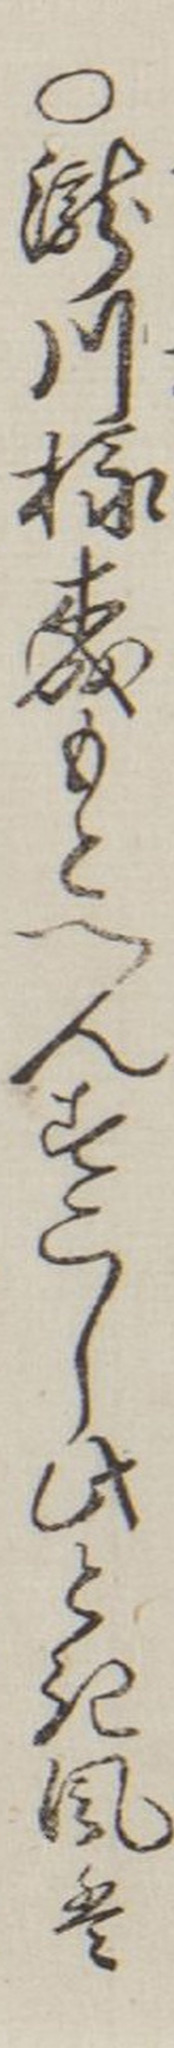○瀧川様森もとへんすこし此とき風は
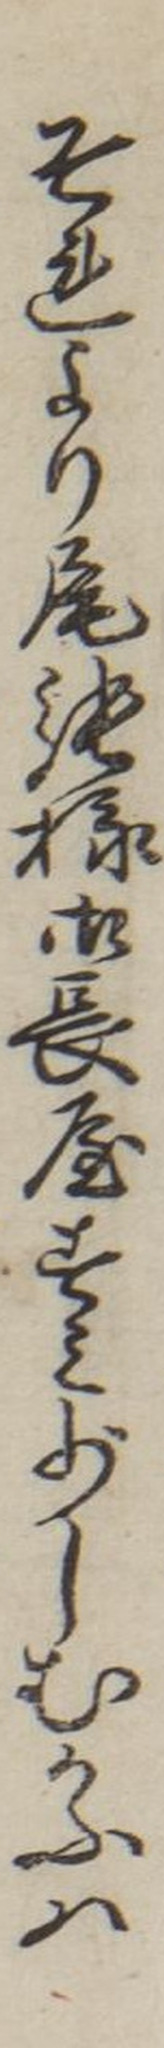それより尾張様御長屋すみ少しむかふは
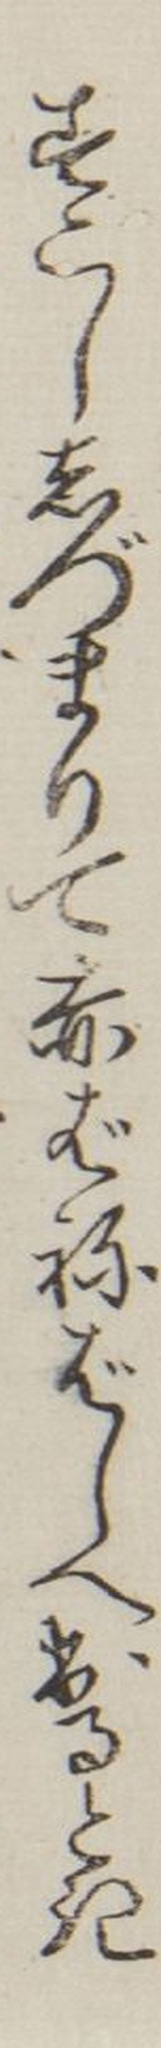すこししづまりて赤ばねばしへ出るとき
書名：るいせう道しるベ　上・中・下
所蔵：あいおいニッセイ同和損保株式会社
